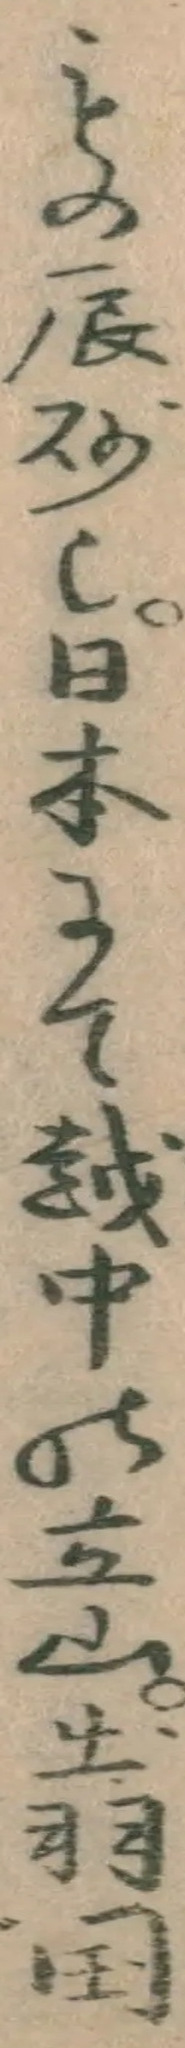もの辰砂也。日本にて越中の立山。出羽国
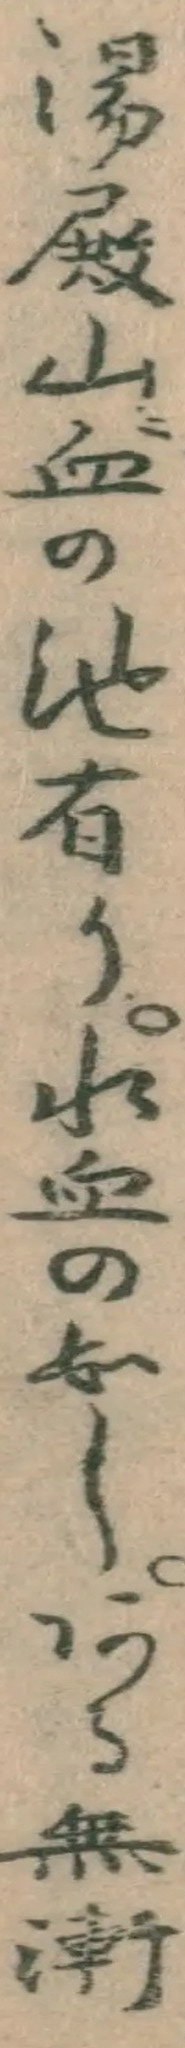湯殿山血の池有り。水血の如し。ある無漸
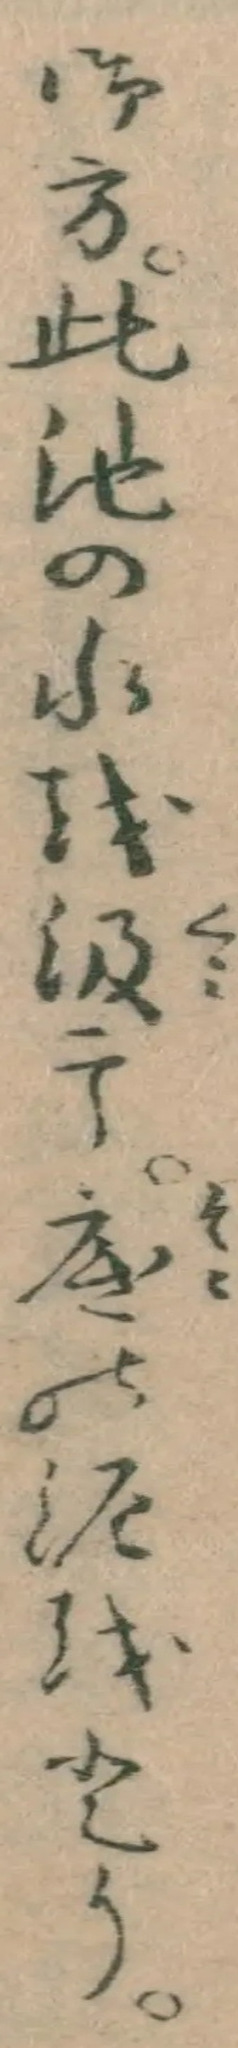御方。此池の水を汲こし。底の泥をとり。
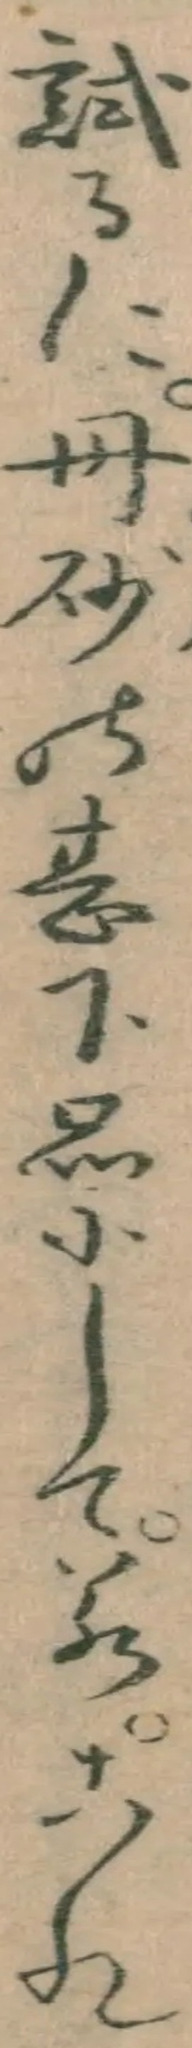試るに。丹砂の甚下品にして。若。これ
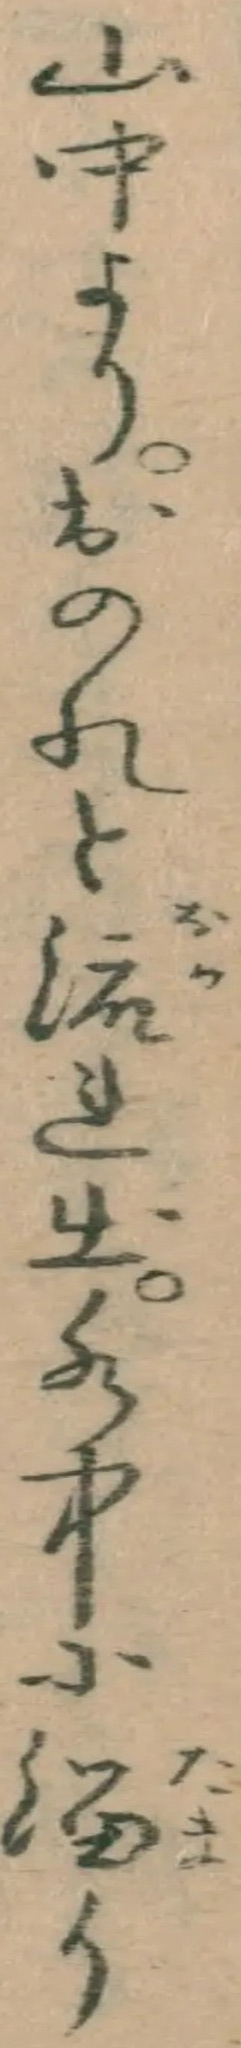山中より。おのれと流れ出。水中に溜り
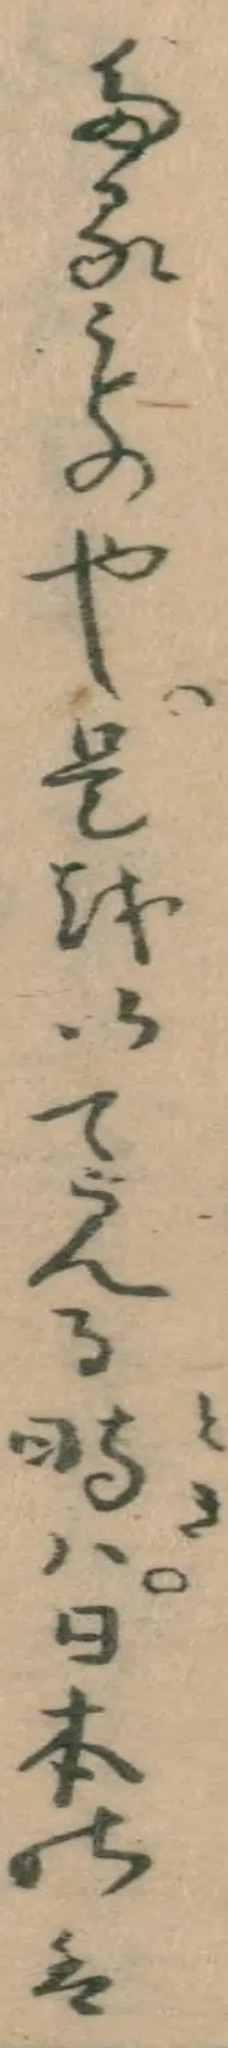たるもの也。是を以て見る時は。日本のは
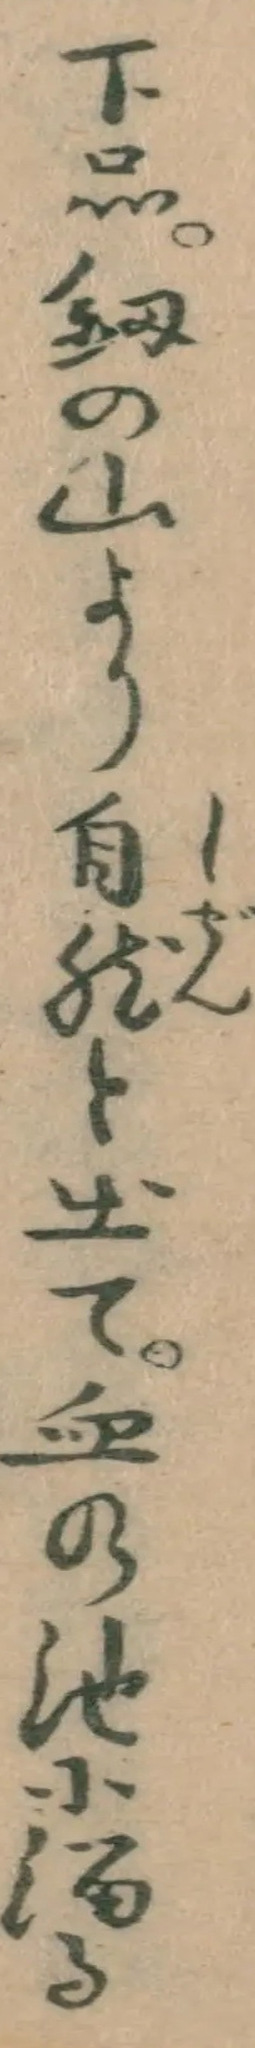下品。剣の山より自然と出て。血の池に溜る
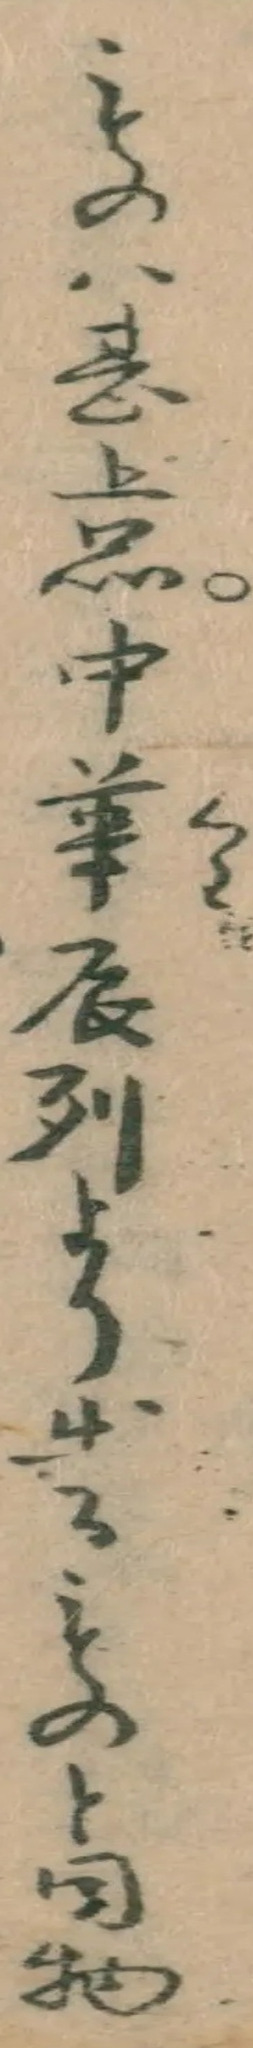ものは甚上品。中華辰列より出るものと同物
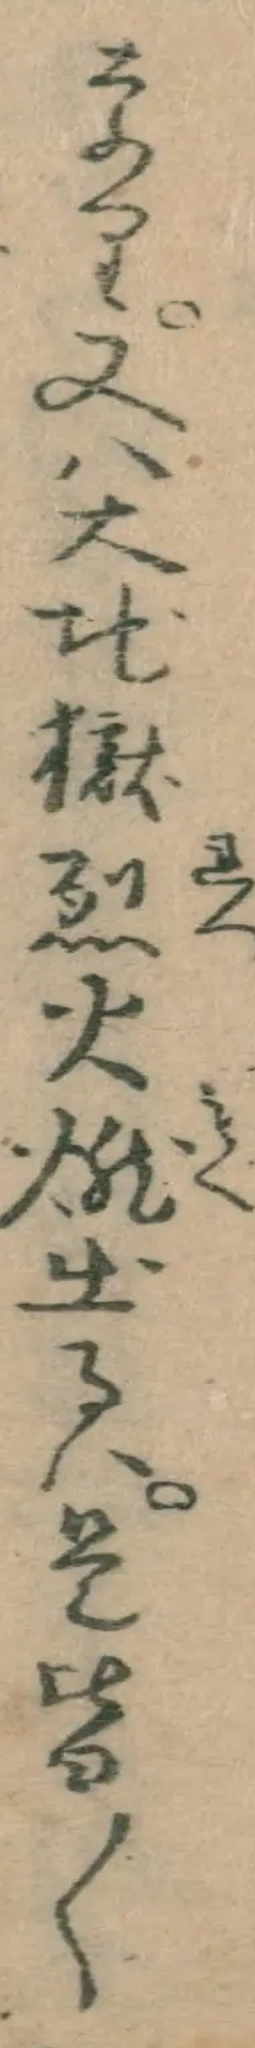なり。又は大地獄烈火燃出るは。是皆〳〵
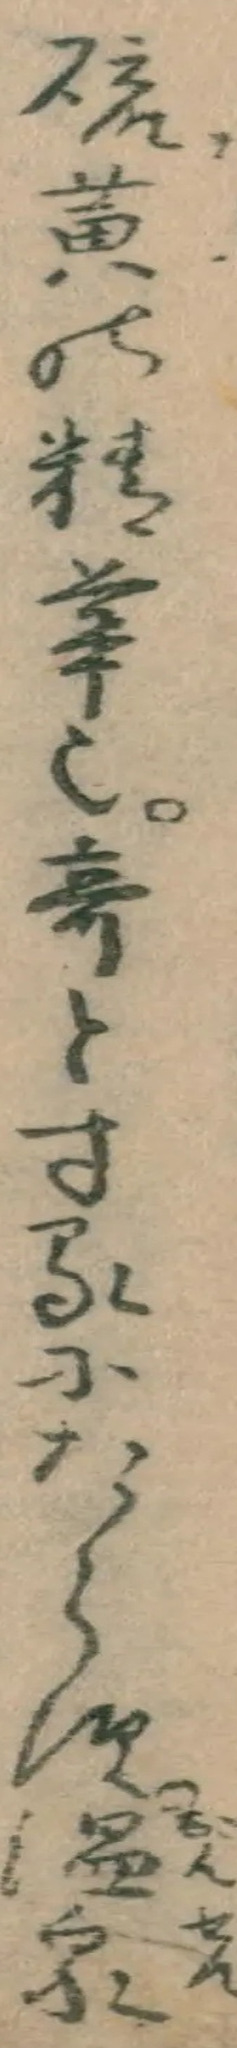硫黄の精華也。奇とするにたらす。温泉
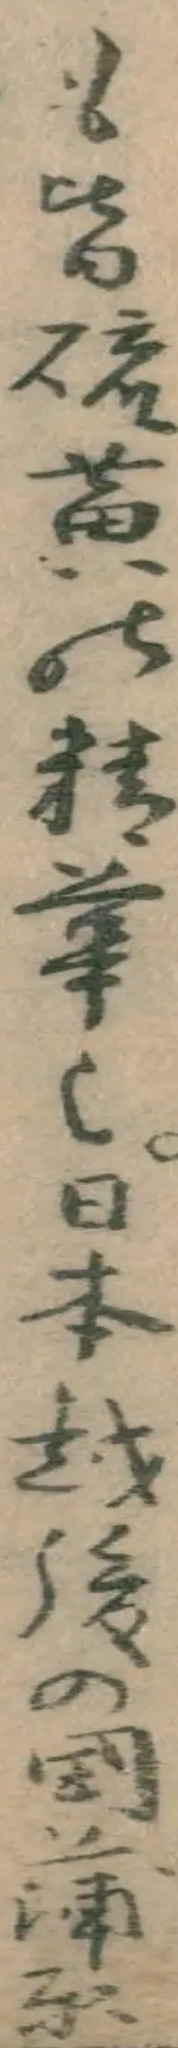も皆硫黄の精華也。日本越後の国蒲原
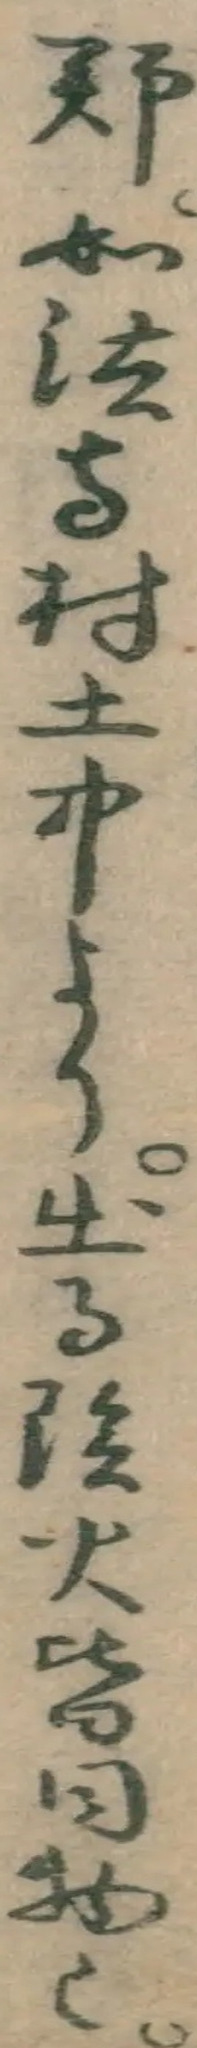郡。如法寺村土中より。出る陰火皆同物也。

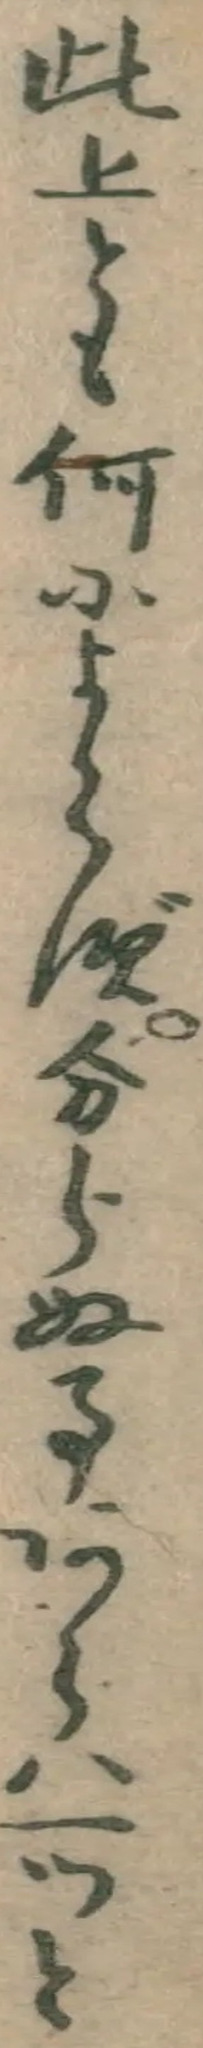此上とも何によらず。分らぬ事あらは一ツと
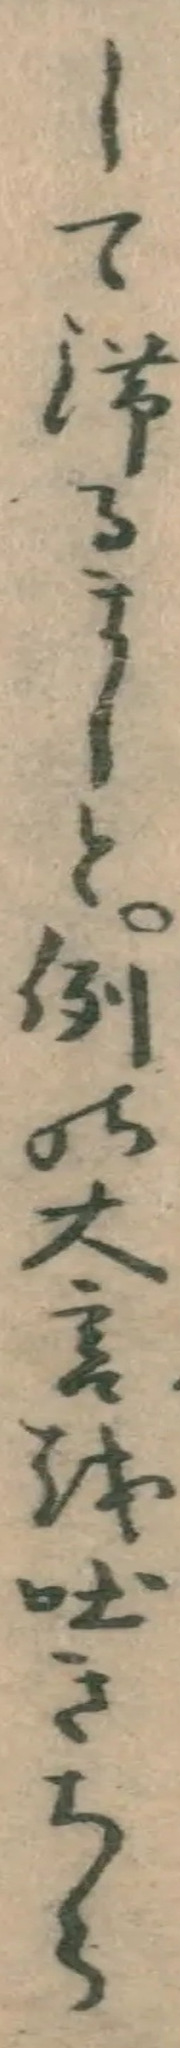して滞るましと。例の大言を吐きちら
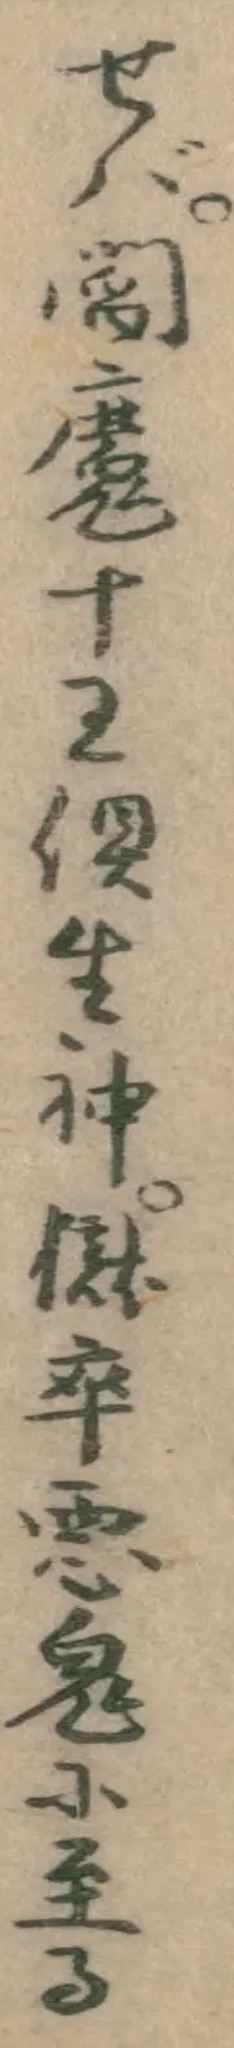せば。閻魔十王俱生神。獄卒悪鬼に至る
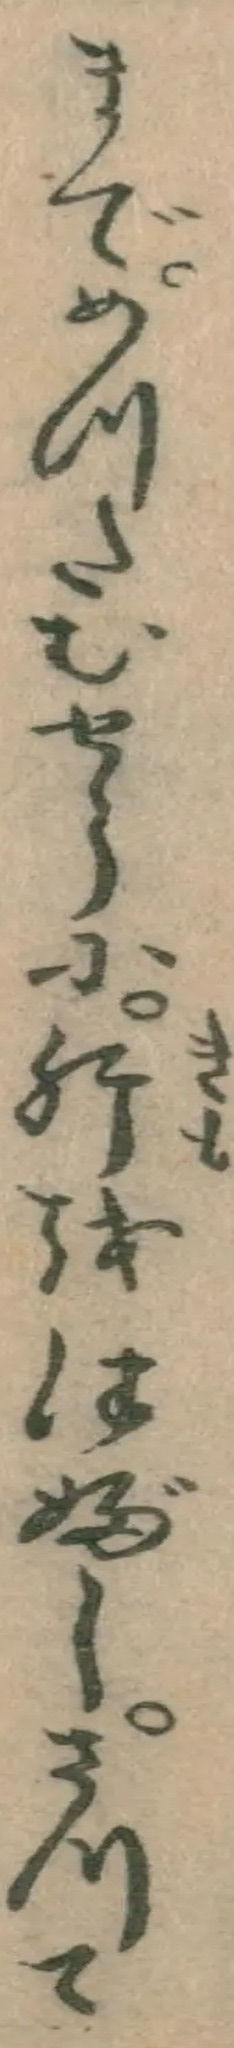まで。めつたむせうに。肝をつぶし。さつて
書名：翻草盲目
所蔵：国立国会図書館 National Diet Library, JAPAN
